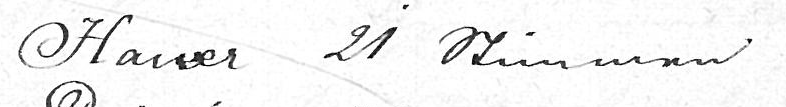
Hauer 21 Stimmen
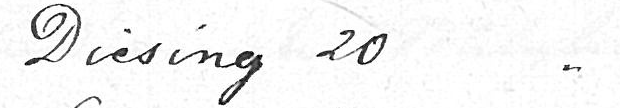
Diesing 20 "
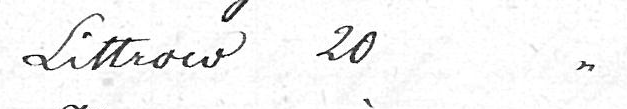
Littrow 20 "
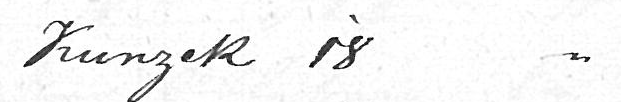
Kunzek 18 "
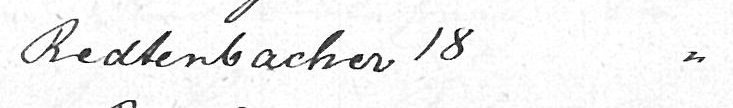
Redtenbacher 18 "
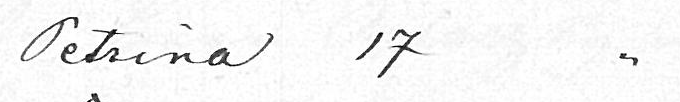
Petrina 17 "
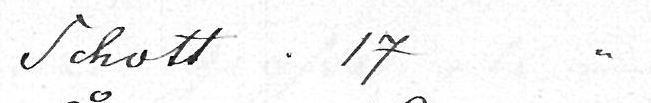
Schott 17 "
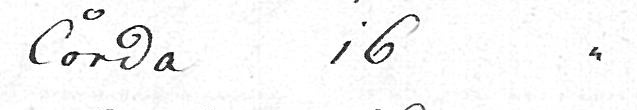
Corda 16 "
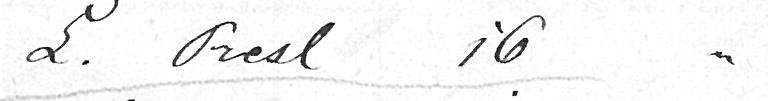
L. Presl 16 "
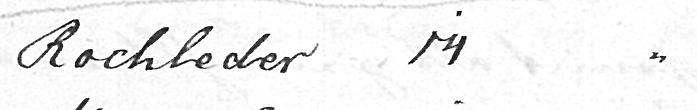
Rochleder 14 "
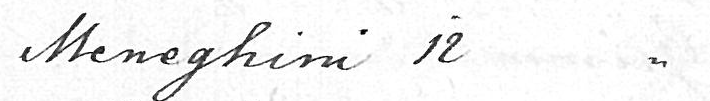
Meneghini 12 "
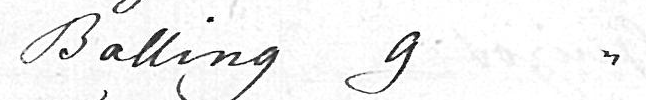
Balling 9 "
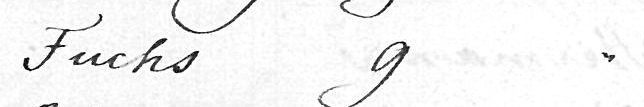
Fuchs 9 "
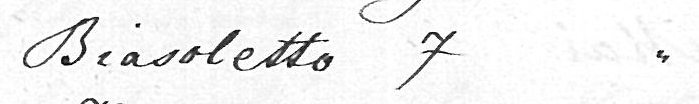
Biasoletta 7 "
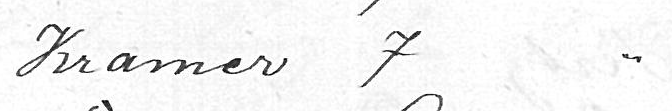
Kramer 7 "
